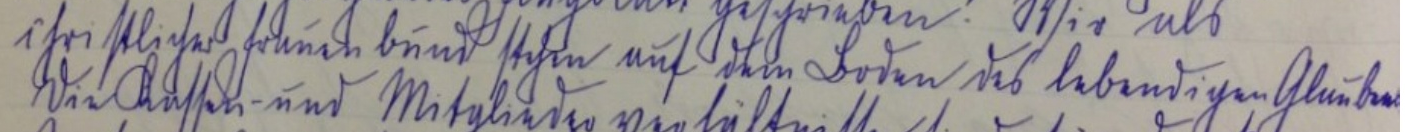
christlicher Frauenbund stehen auf dem Boden des lebendigen Glaubens.
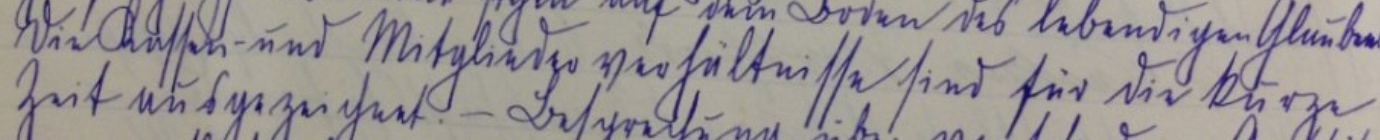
Die Kassen- und Mitgliederverhältnisse sind für die kurze
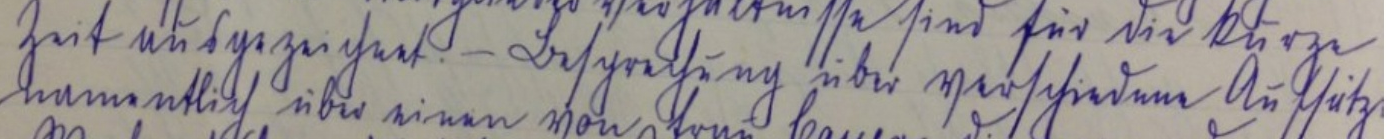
Zeit ausgezeichnet. – Besprechung über verschiedene Aufsätze
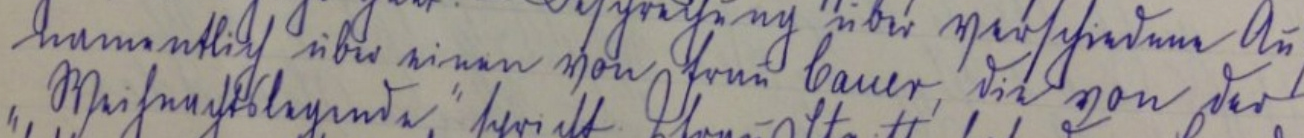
namentlich über einen von Frau Cauer, die von der
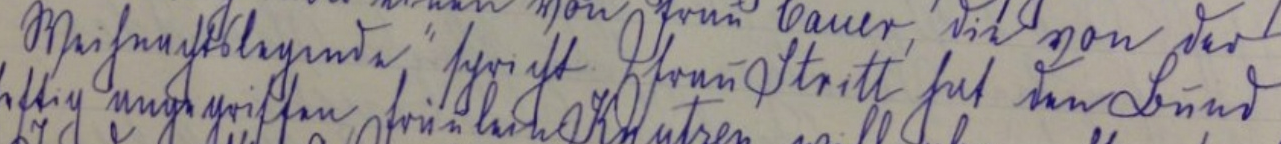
„Weihnachtslegende" spricht. Frau Stritt hat den Bund
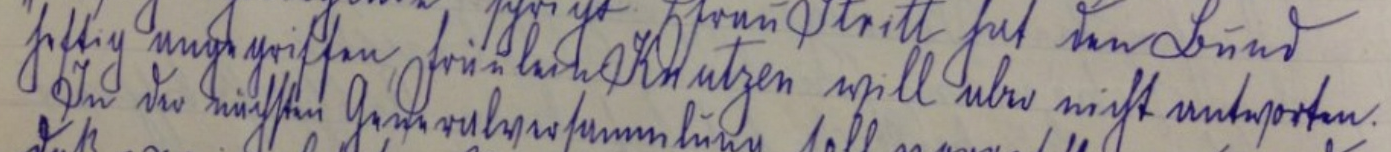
heftig angegriffen, Fräulein Knutzen will aber nicht antworten.
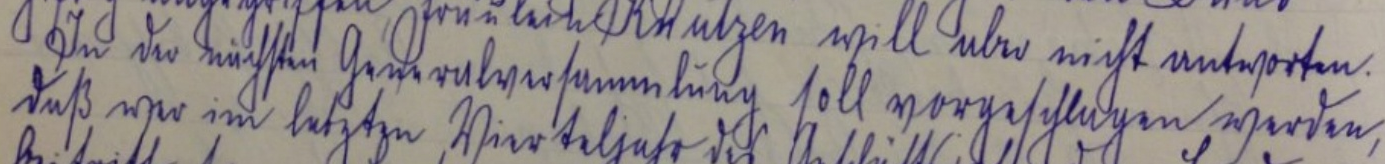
In der nächsten Generalversammlung soll vorgeschlagen werden,
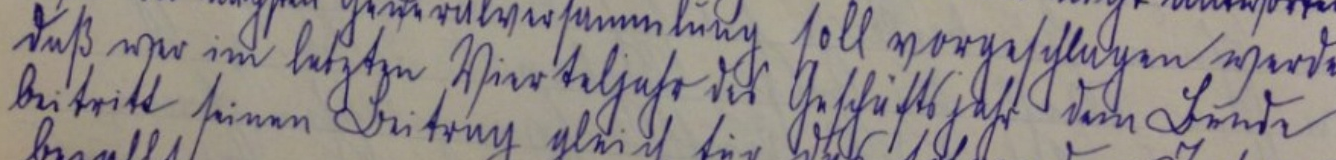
daß wer im letzten Vierteljahr des Geschäftsjahr dem Bunde
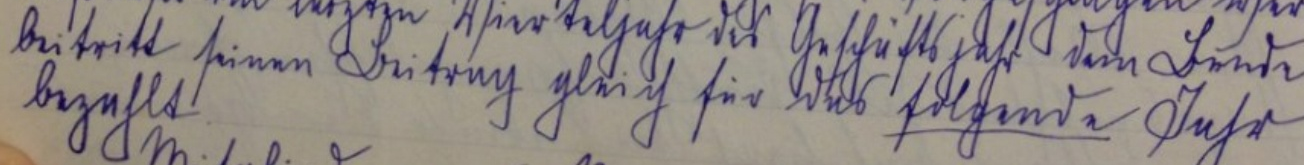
beitritt seinen Beitrag gleich für das folgende Jahr
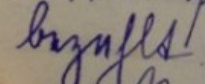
bezahlt.
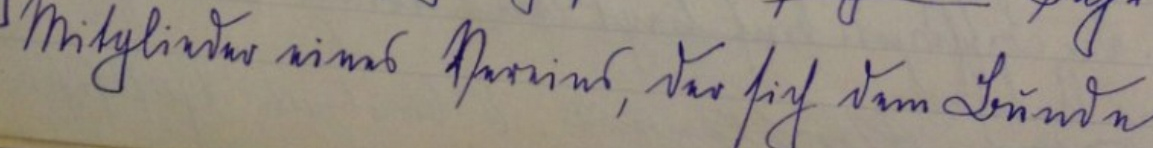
Mitlgieder eines Vereins, der sich dem Bunde
